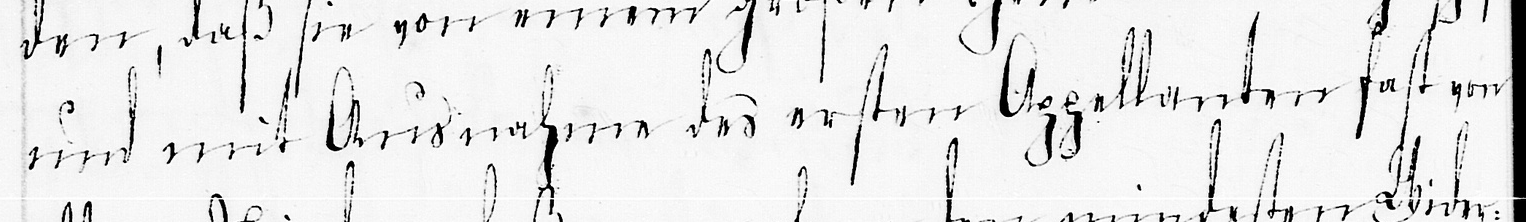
und mit Ausnahme des ersten Appellanten fast von
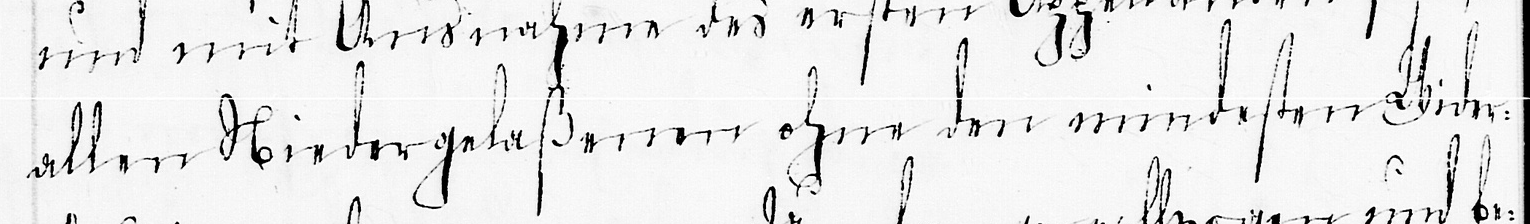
allen Niedergelaßenen ohne den mindesten Wider¬
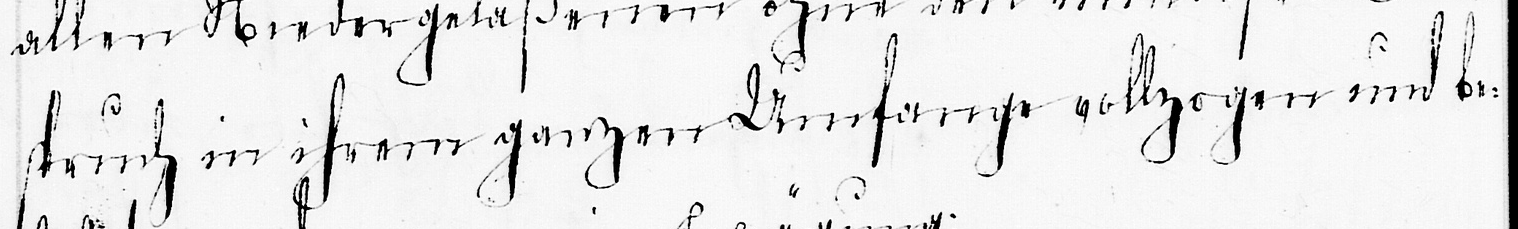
spruch in ihrem ganzen Umfange vollzogen und be¬
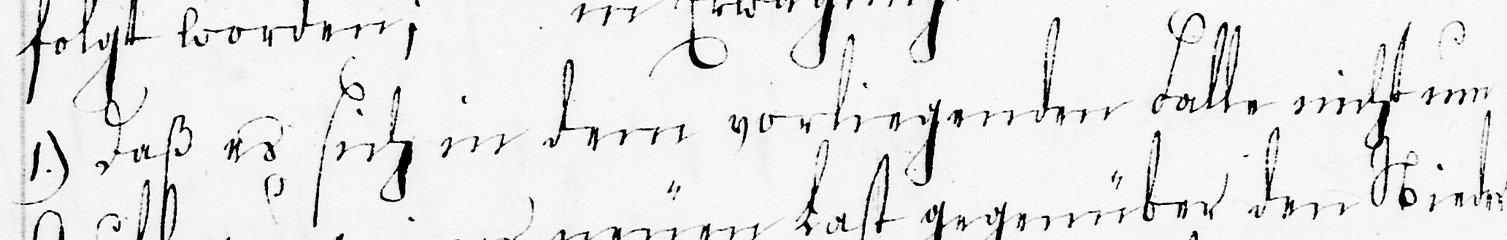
1.) Daß es sich in dem vorliegenden Falle nicht um
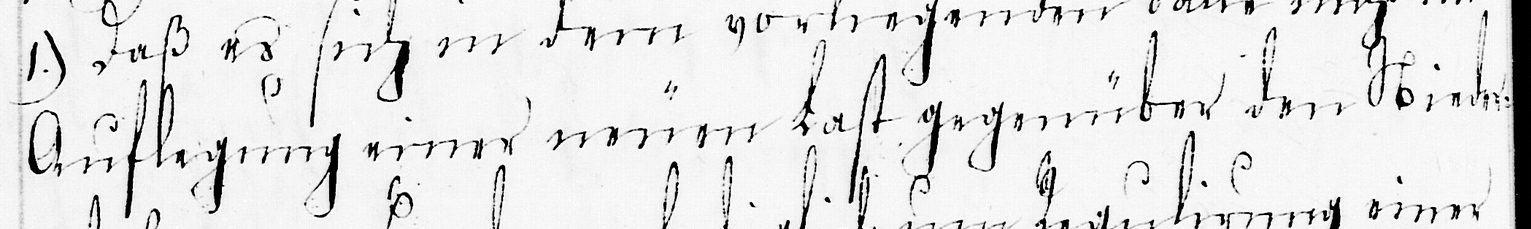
Auflegung einer neuen Last gegenüber den Niede¬
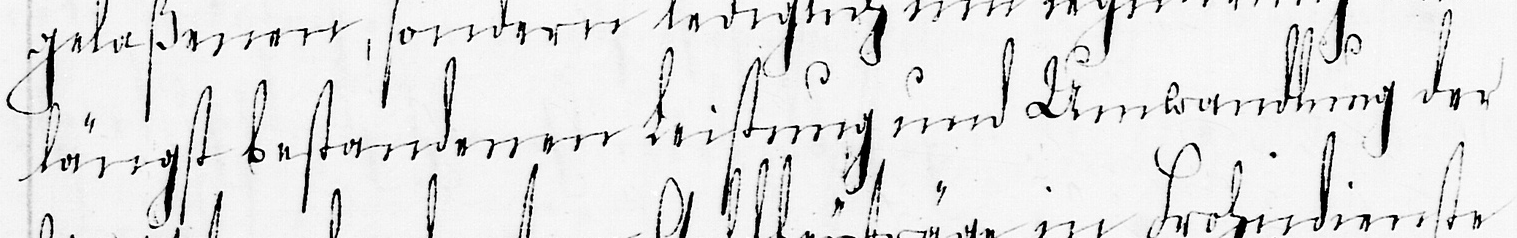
längst bestandenen Leistung und Umwandlung der
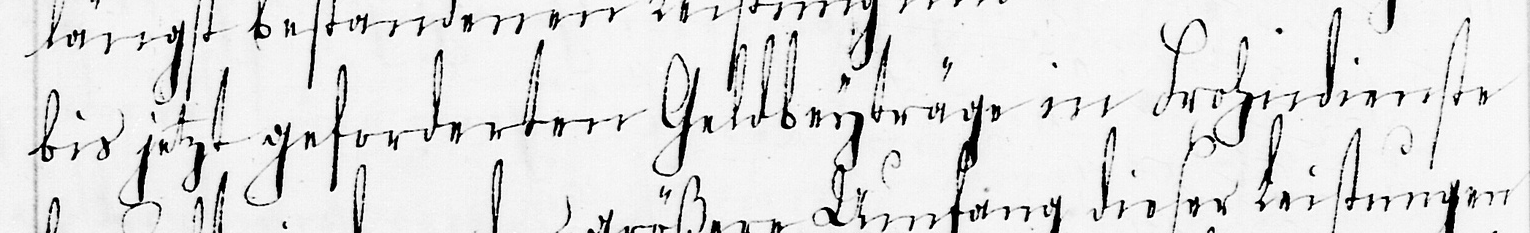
bis jetzt geforderten Geldbeyträge in Frohndienste
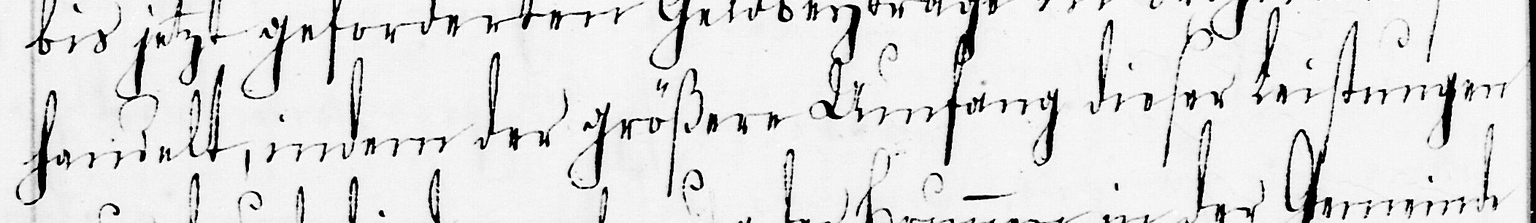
handelt, indem der größere Umfang dieser Leistungen
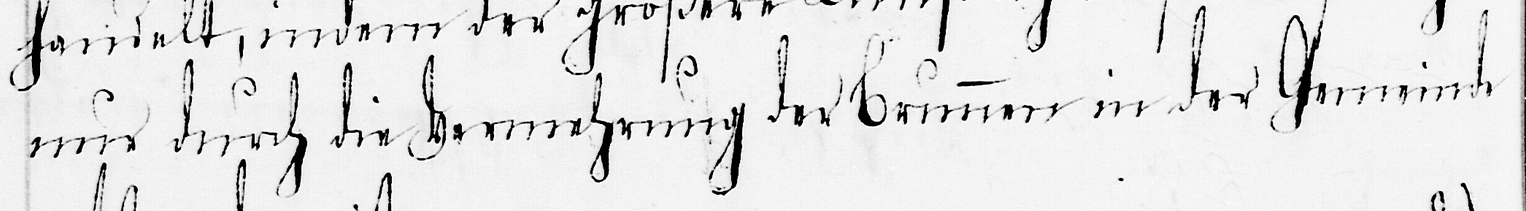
nur durch die Vermehrung der Brunnen in der Gemeinde
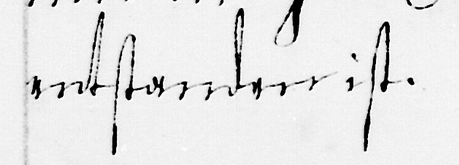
entstanden ist.
